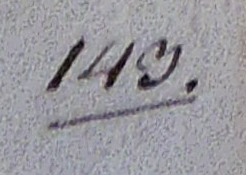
143.
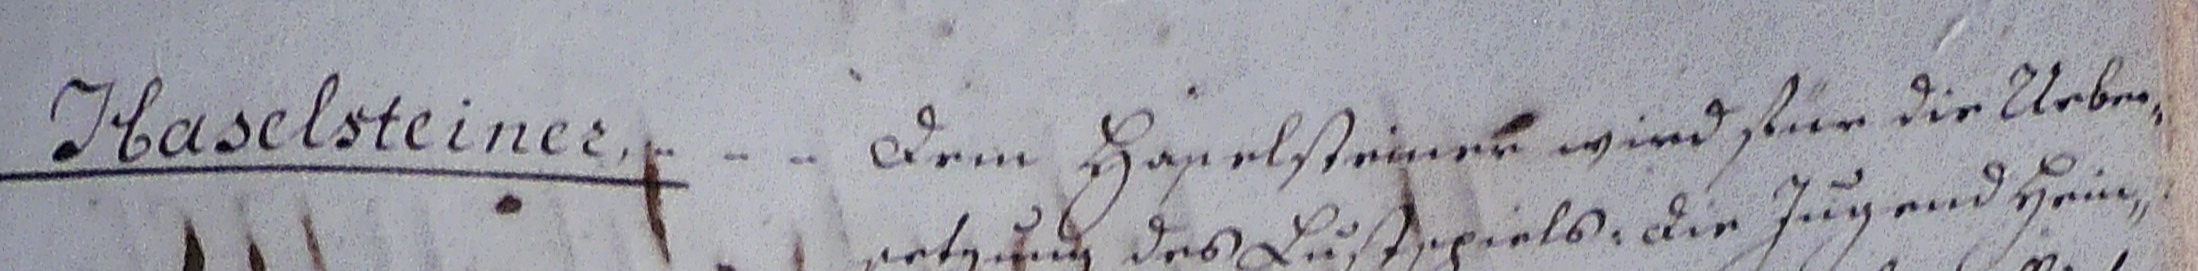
Haselsteiner. .. .. .. Dem Haselsteiner wird für die Ueber¬
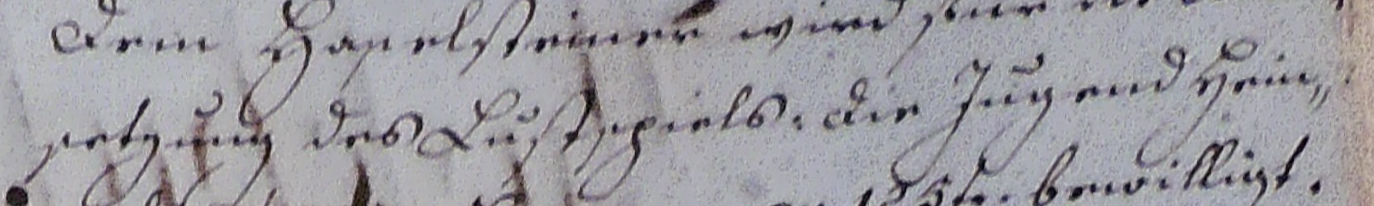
setzung des Lustspiels: Die Jugend Hein¬,
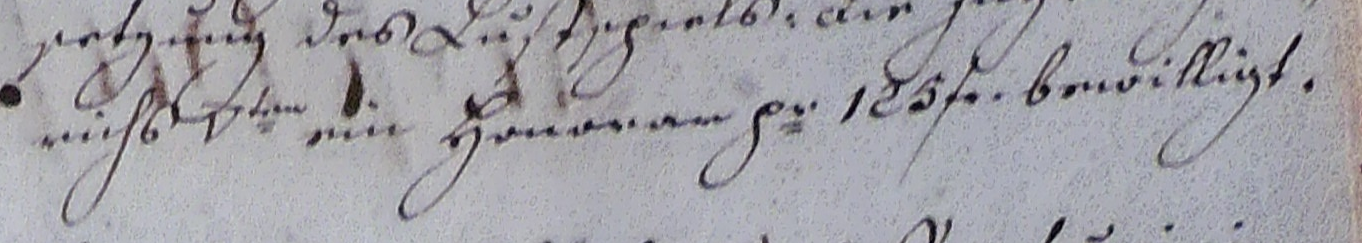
ichs 1ste͇n ein Honorar pr͇ 125fr. bewilligt.
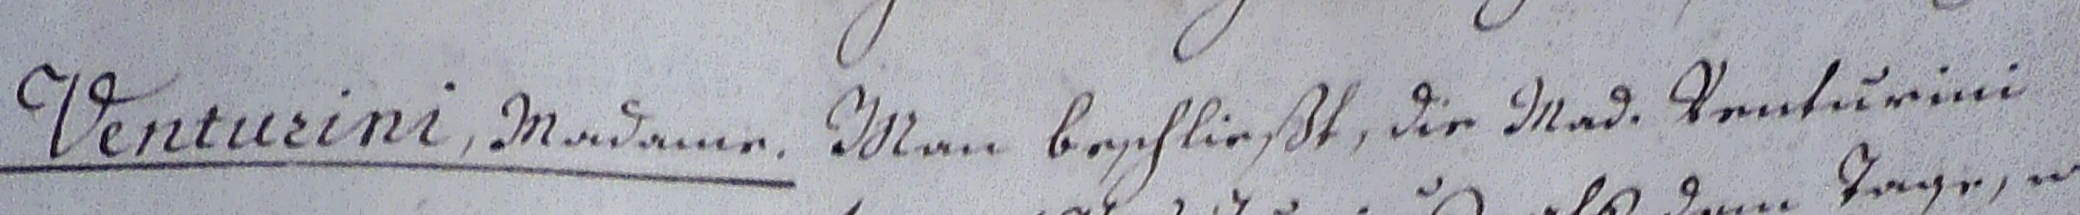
Venturini, Madame. Man beschließt, die Mad: Venturini
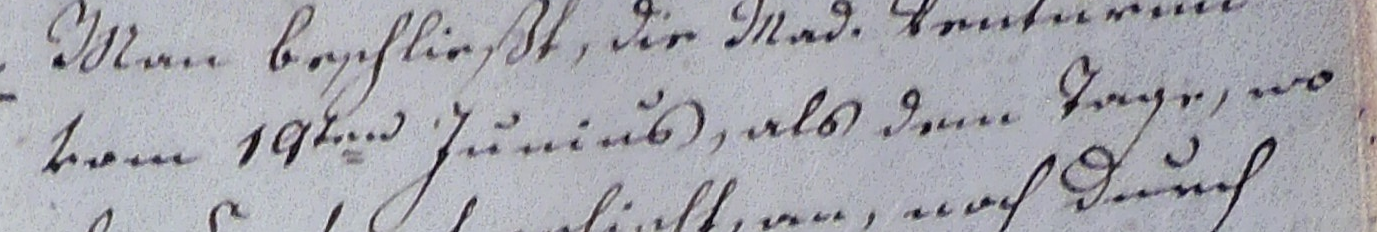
vom 19te͇n Junius, als dem Tage, wo
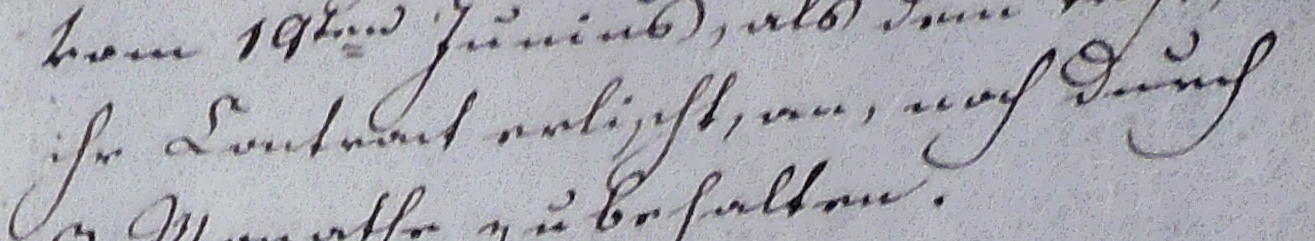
ihr Contract erlischt, an, noch durch
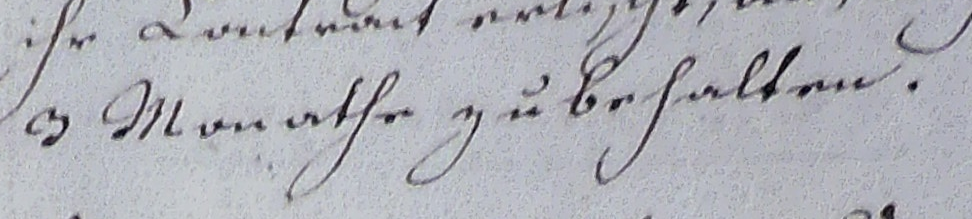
3 Monathe zu behalten.
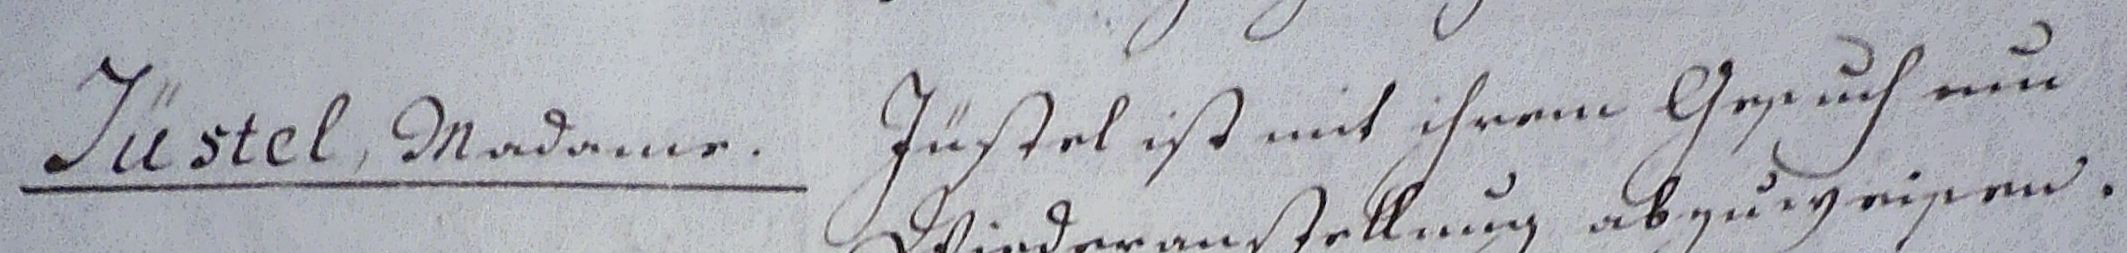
Jüstel, Madame. Jüstel ist mit ihrem Gesuch um
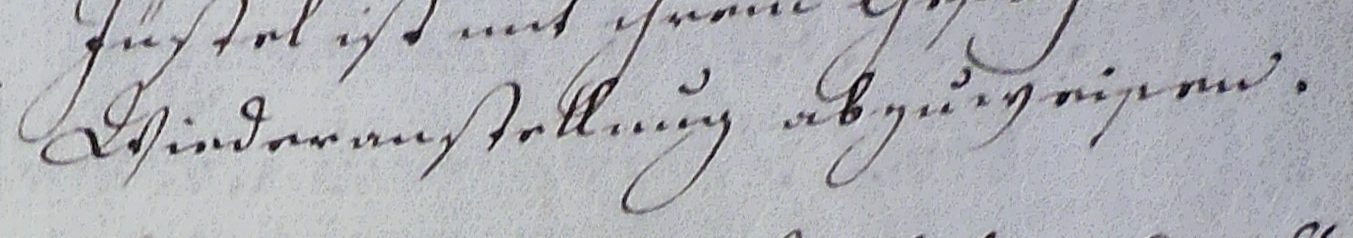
Wiederanstellung abzuweisen.
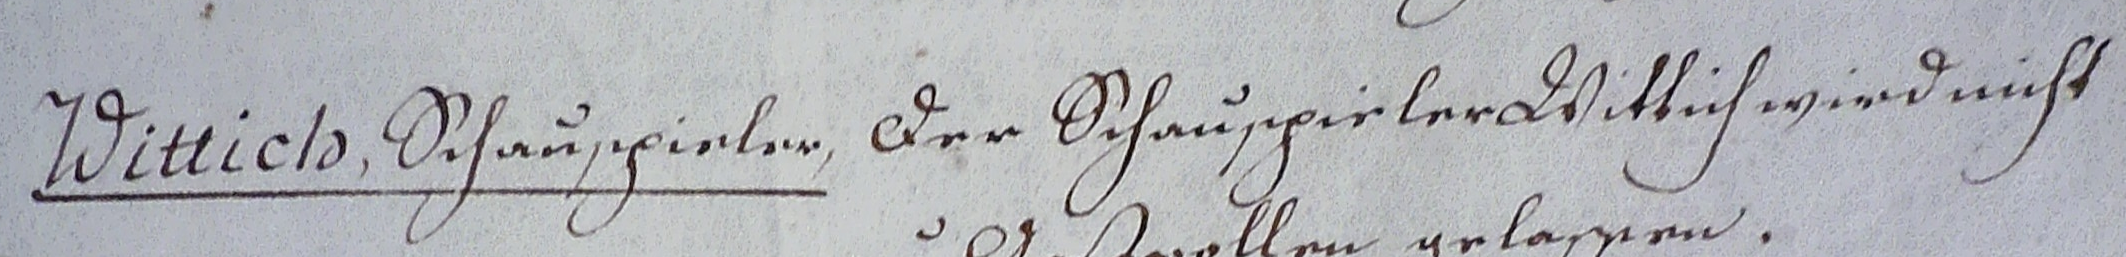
Wittich, Schauspieler, Der Schauspieler Wittich wird nicht
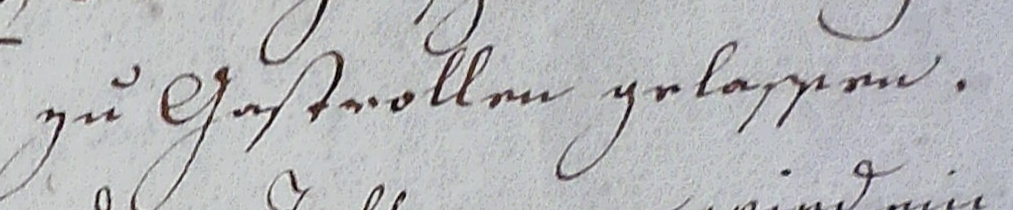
zu Gastrollen gelassen.
